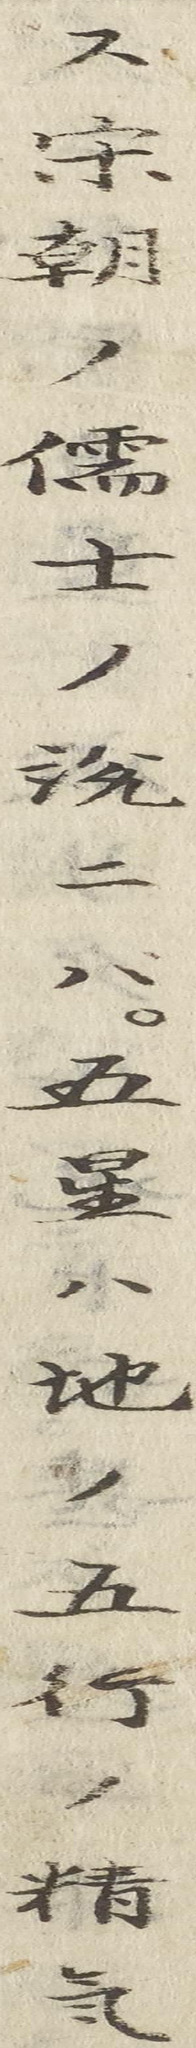ス宋朝ノ儒士ノ説ニハ。五星ハ地ノ五行ノ精気

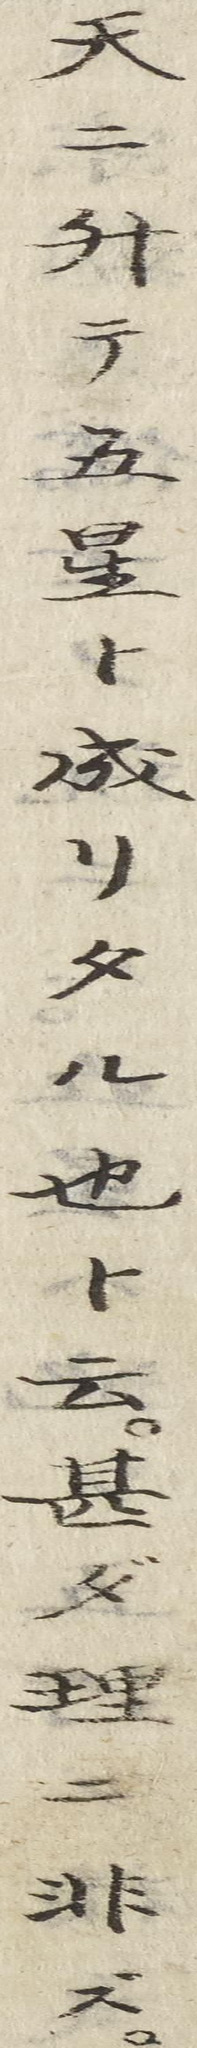天ニ升テ五星ト成リタル也ト云。甚ダ理ニ非ズ。
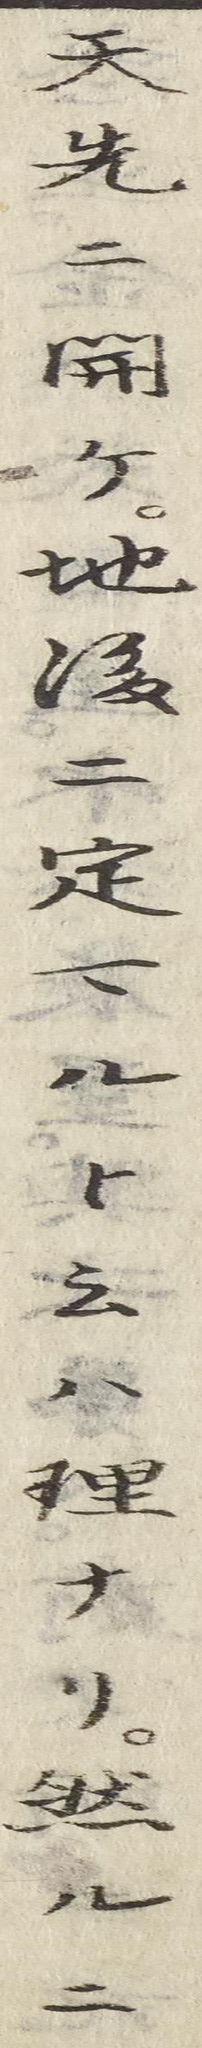天先ニ開ケ。地後ニ定マルト云ハ理ナリ。然ルニ
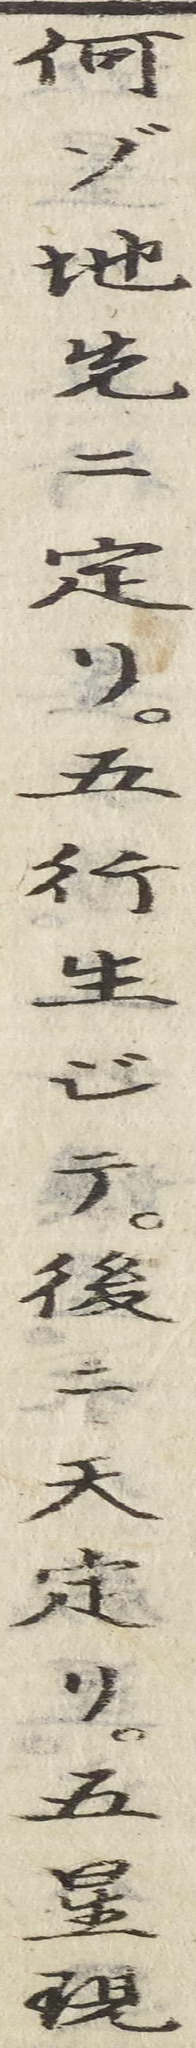何ゾ地先ニ定リ。五行生ジテ。後ニ天定リ。五星現
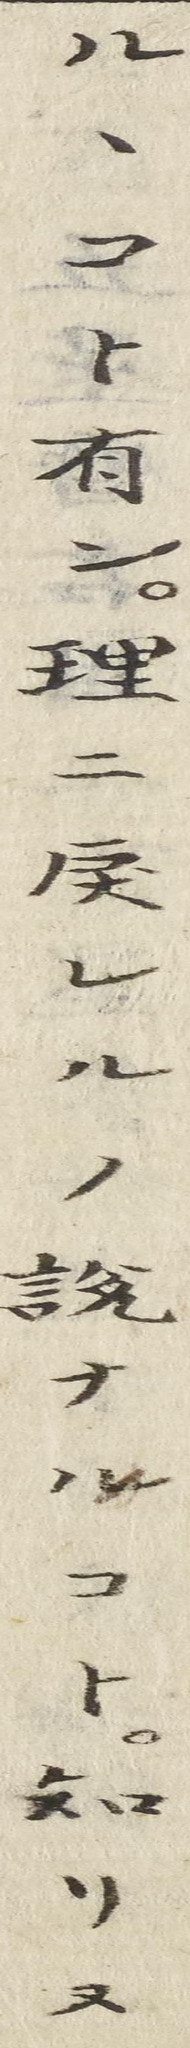ルヽコト有ン。理ニ戻レルノ説ナルコト。知リヌ
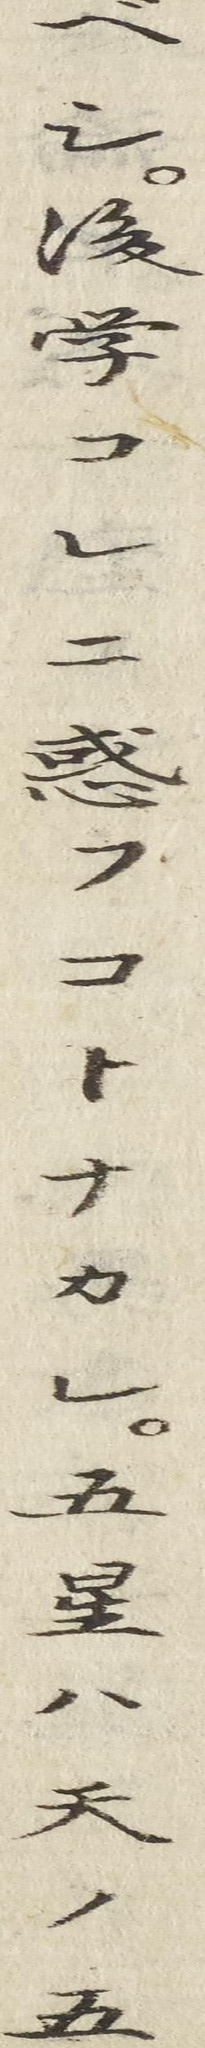ベシ。後学コレニ惑フコトナカレ。五星ハ天ノ五
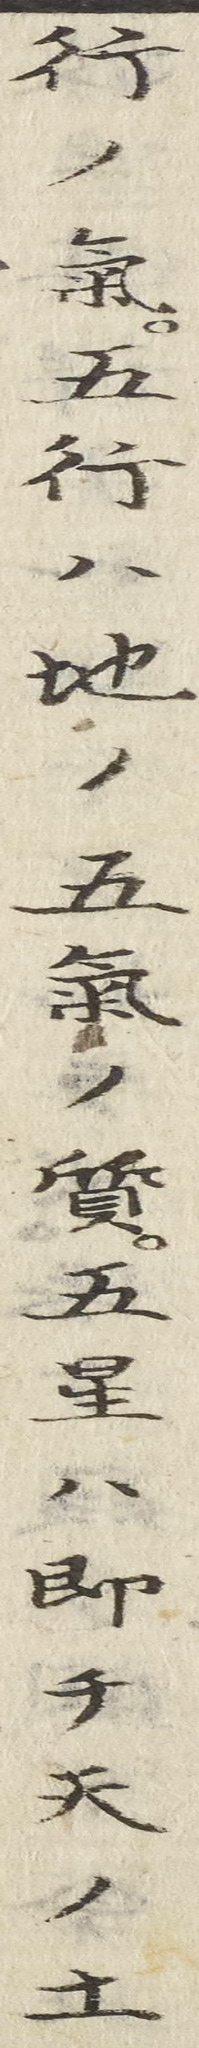行ノ気。五行ハ地ノ五気ノ質。五星ハ即チ天ノ土
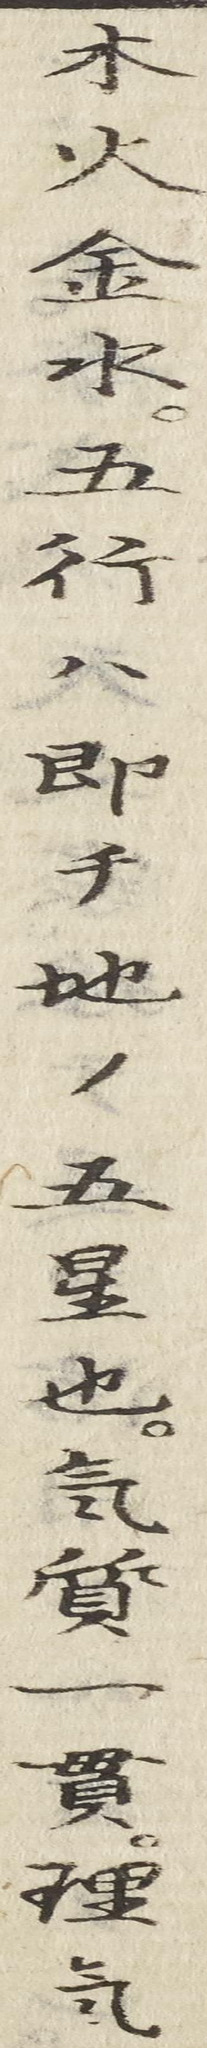木火金水。五行ハ即チ地ノ五星也。気質一貫。理気
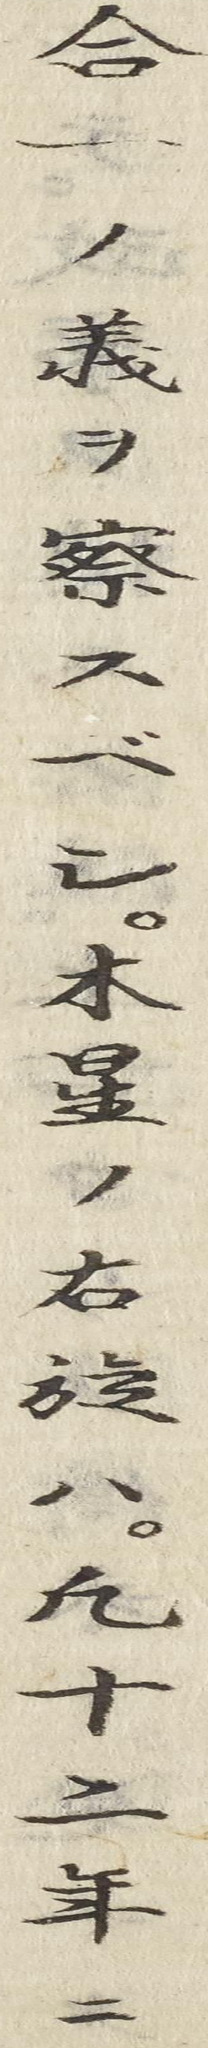合一ノ義ヲ察スベシ。木星ノ右旋ハ。凡十二年ニ
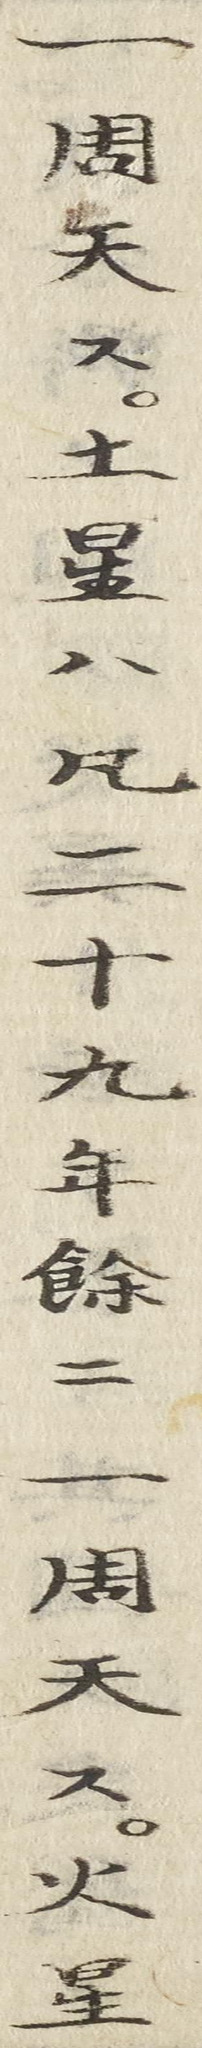一周天ス。土星ハ凡二十九年余ニ一周天ス。火星
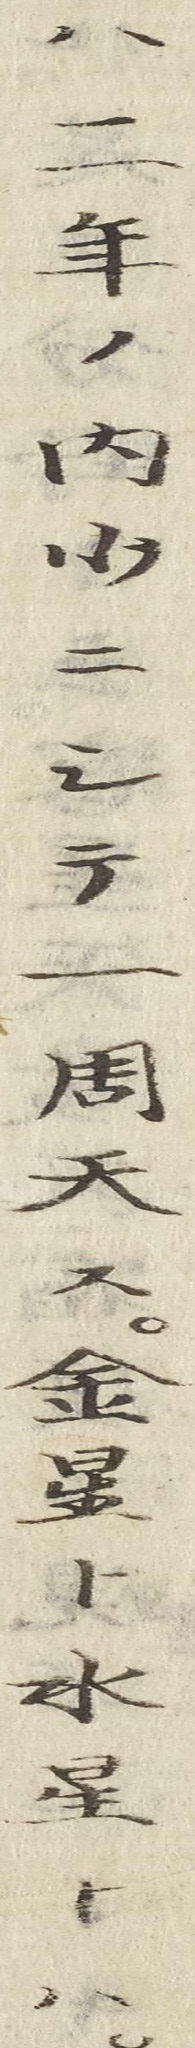ハ二年ノ内少ニシテ一周天ス。金星ト水星トハ。
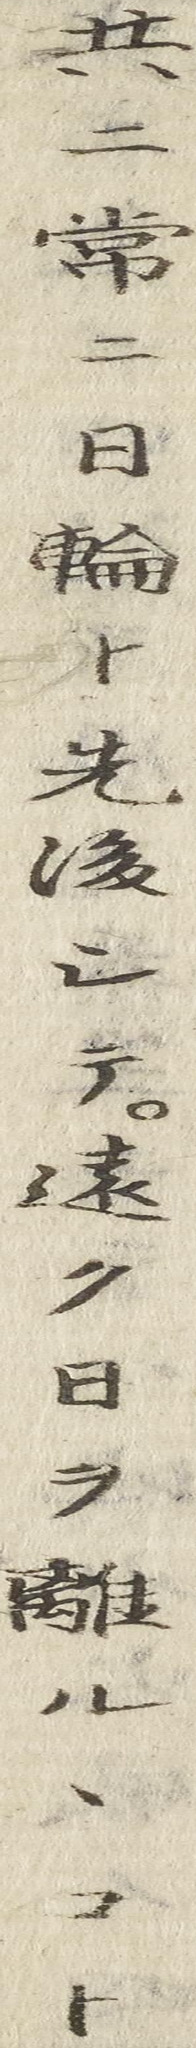共ニ常ニ日輪ト先後シテ。遠ク日ヲ離ルヽコト
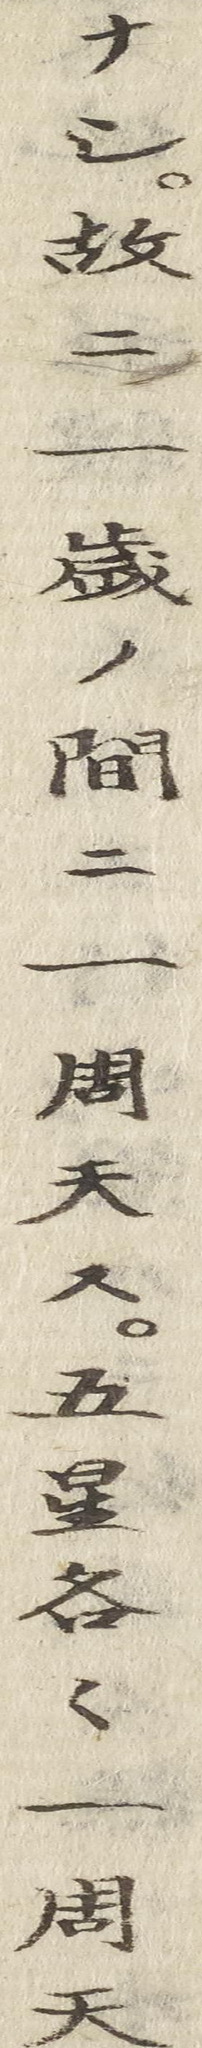ナシ。故ニ一歳ノ間ニ一周天ス。五星各々一周天
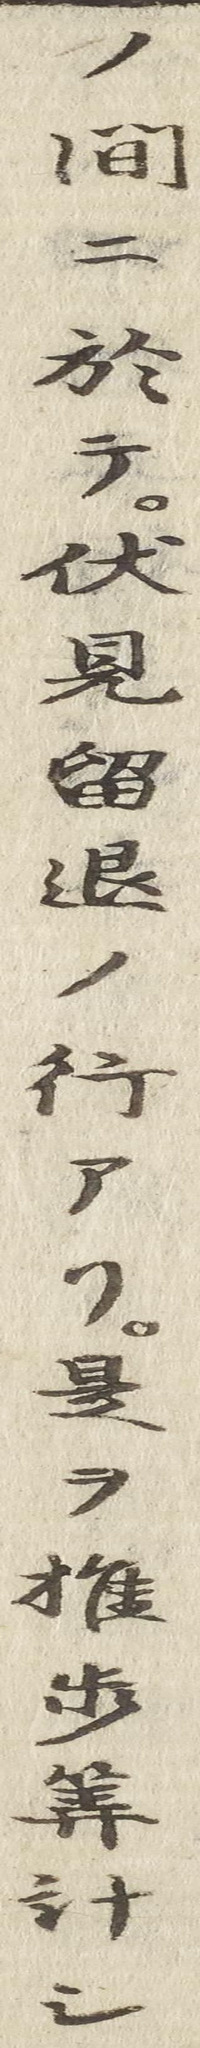ノ間ニ於テ。伏見留退ノ行アリ。是ヲ推歩算計シ
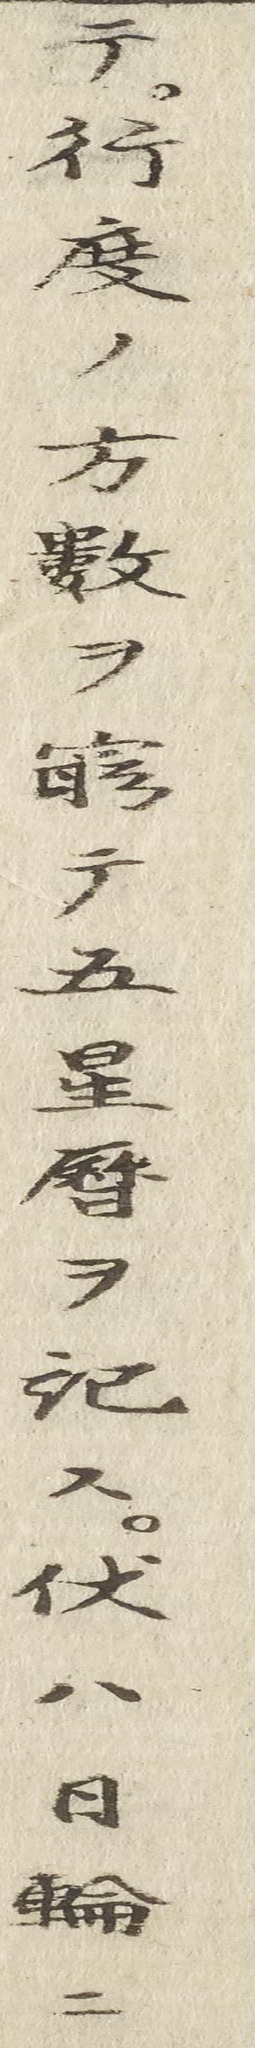テ。行度ノ方数ヲ窮テ五星暦ヲ記ス。伏ハ日輪ニ
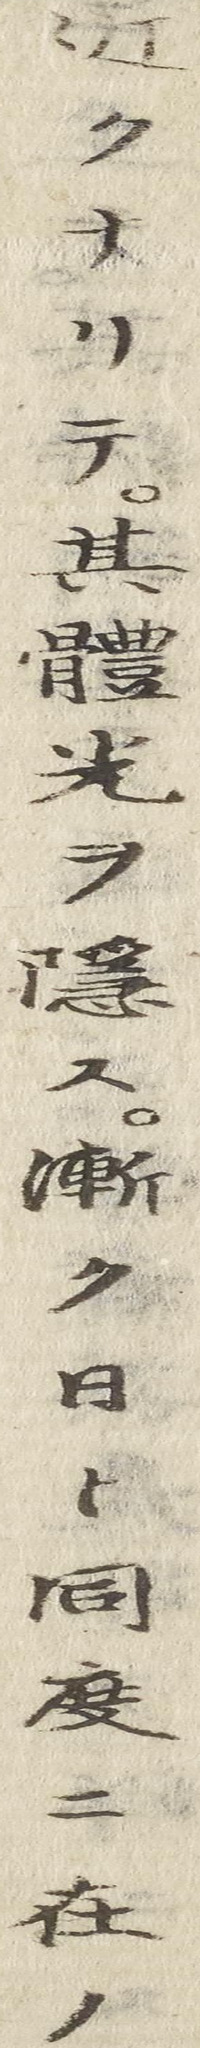近クナリテ。其体光ヲ隠ス。漸ク日ト同度ニ在ノ
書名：大略天学名目鈔　天經或問附録
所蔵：東京大学地震研究所図書室 Earthquake Research Institute Library, The University of Tokyo, JAPAN
